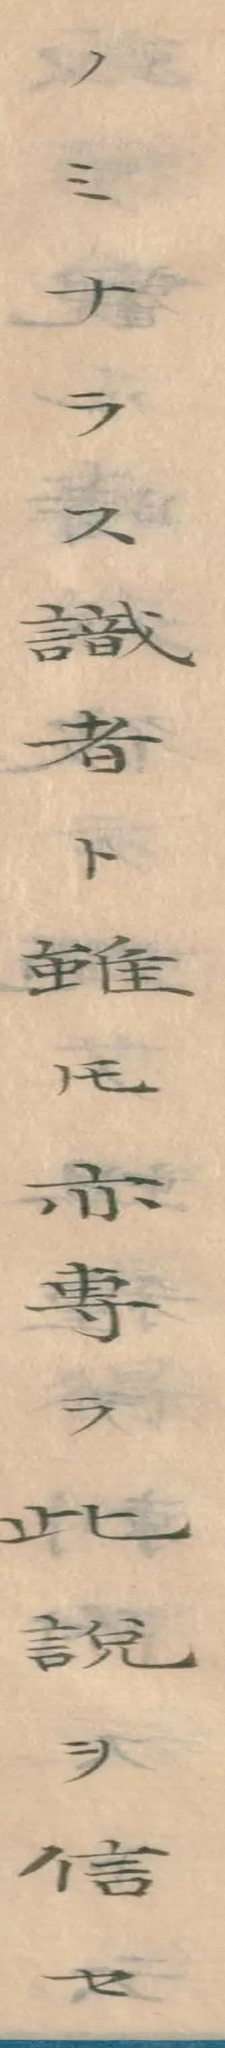ノミナラス識者ト雖トモ亦専ラ此説ヲ信セ
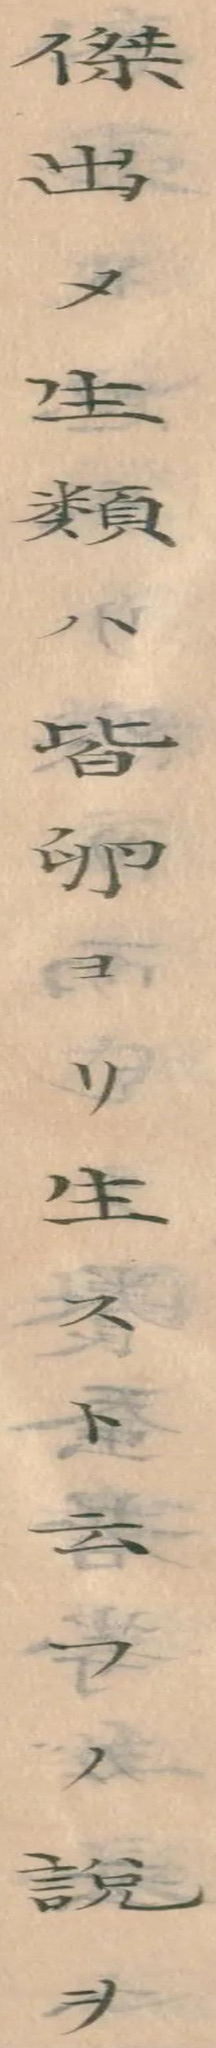傑出シテ生類ハ皆卵ヨリ生スト云フノ説ヲ
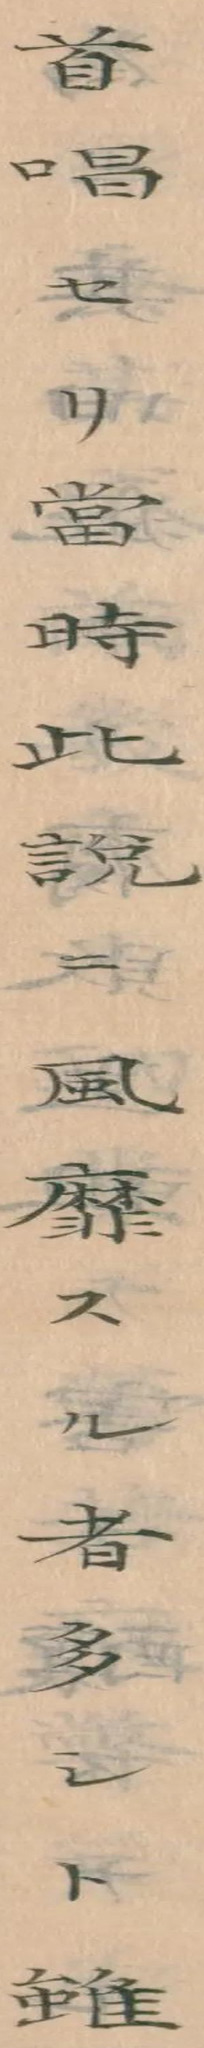首唱セリ当時此説ニ風靡スル者多シト雖
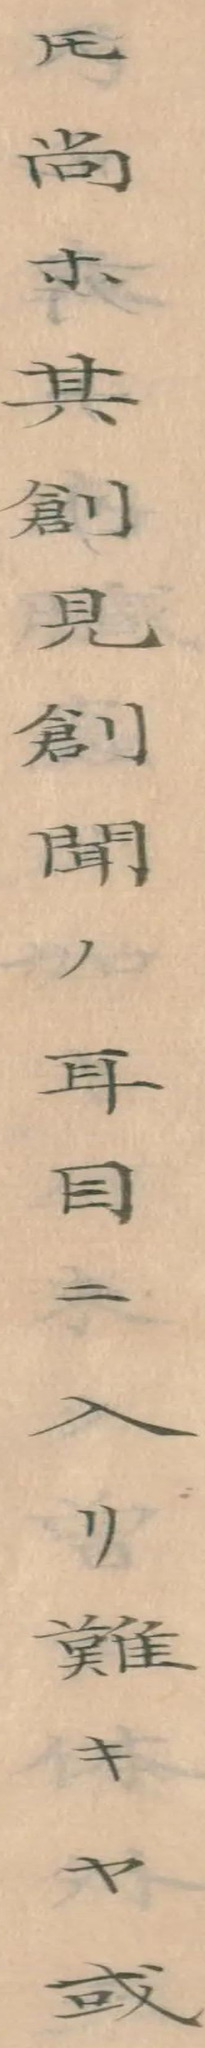トモ尚ホ其創見創聞ノ耳目ニ入リ難キヤ或
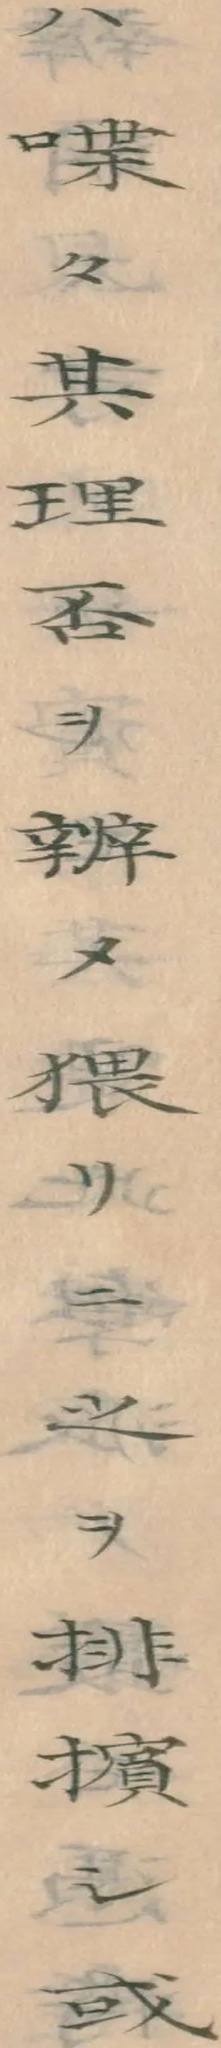ハ喋々其理否ヲ弁シテ猥リニ之ヲ排擯シ或
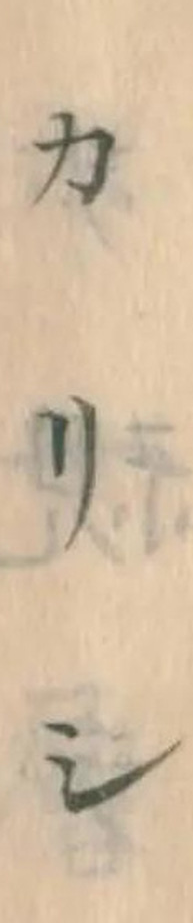カリシ
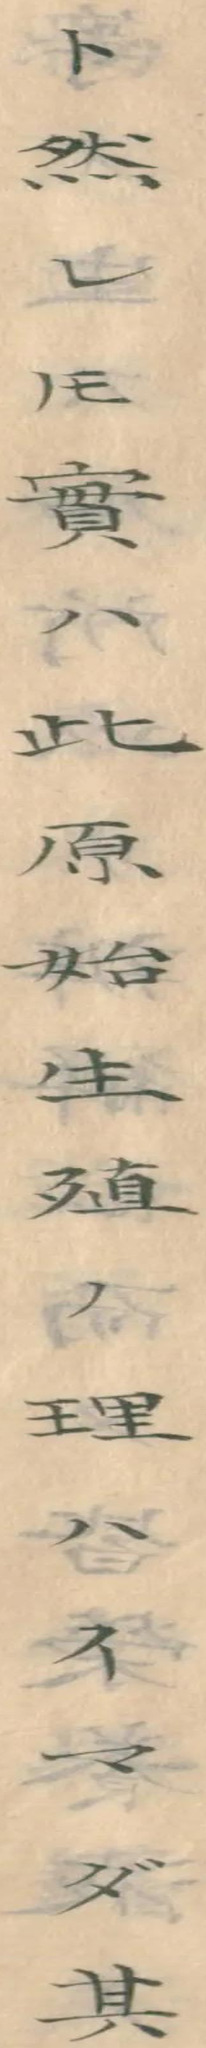ト然レトモ実ハ此原始生殖ノ理ハイマダ其
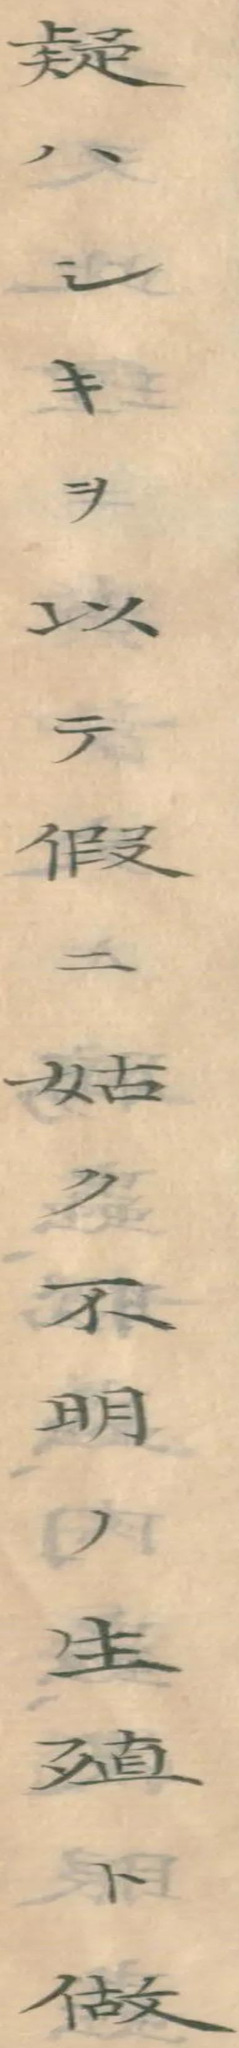疑ハシキヲ以テ仮ニ姑ク不明ノ生殖ト做

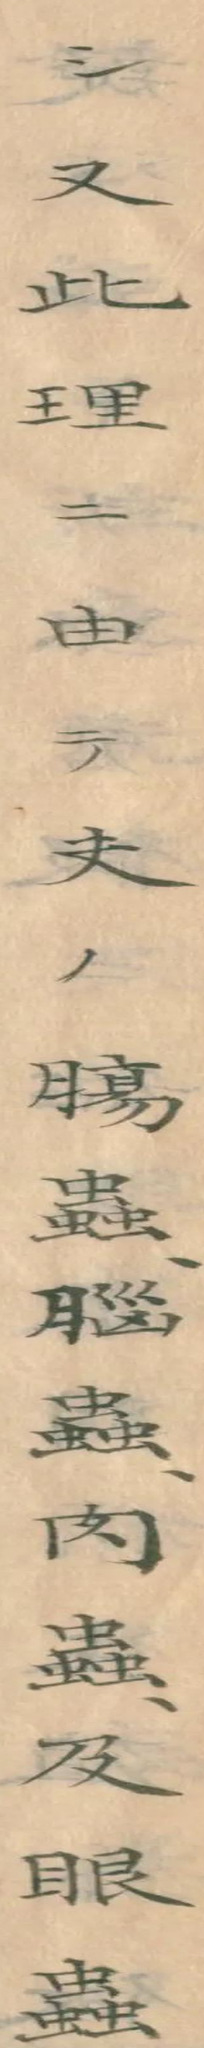シ又此理ニ由テ夫ノ腸虫、脳虫、内虫、及眼虫
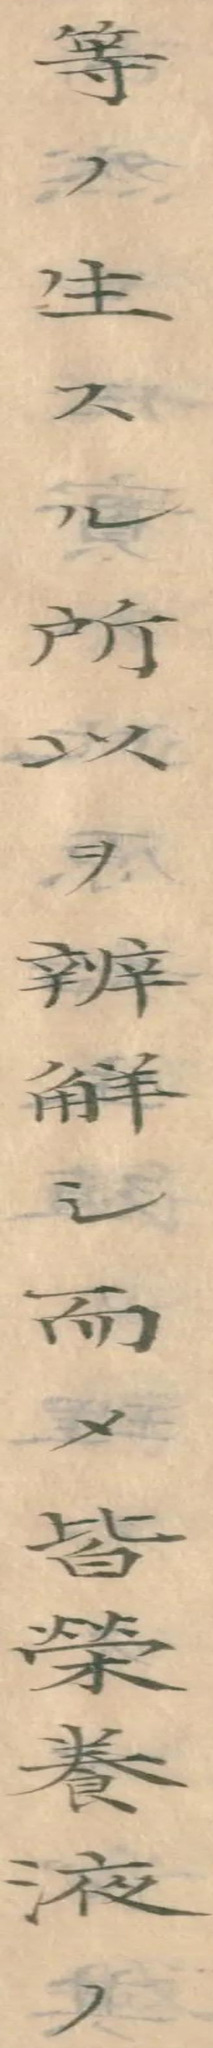等ノ生スル所以ヲ弁解シ而シテ皆栄養液ノ
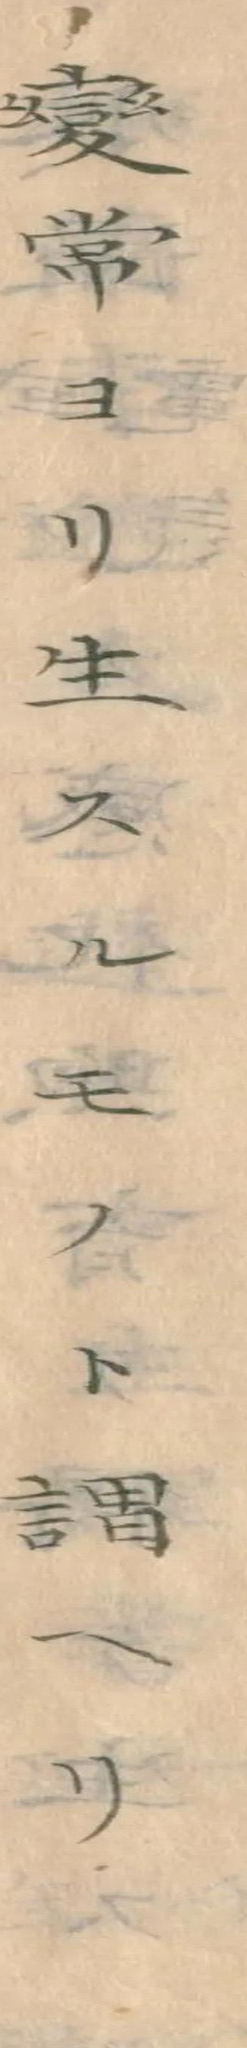変常ヨリ生スルモノト謂ヘリ
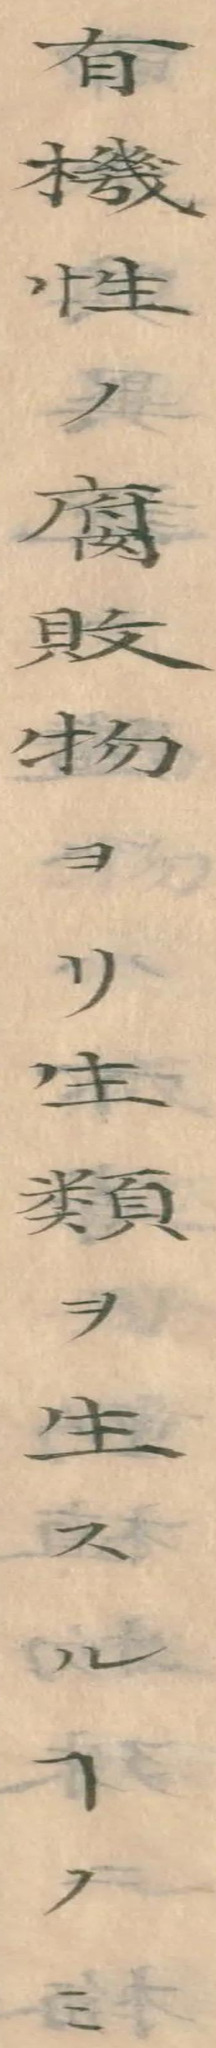有機性ノ腐敗物ヨリ生類ヲ生スルコトノミ
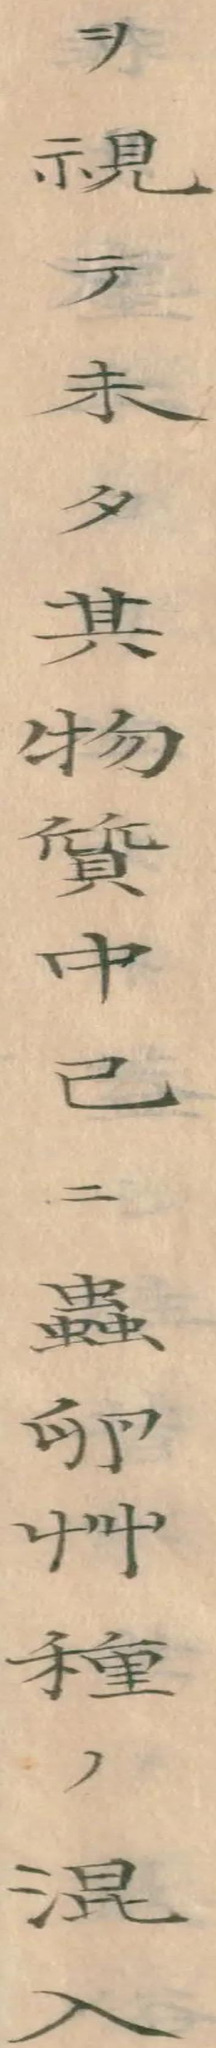ヲ視テ未タ其物質中已ニ虫卵草種ノ混入
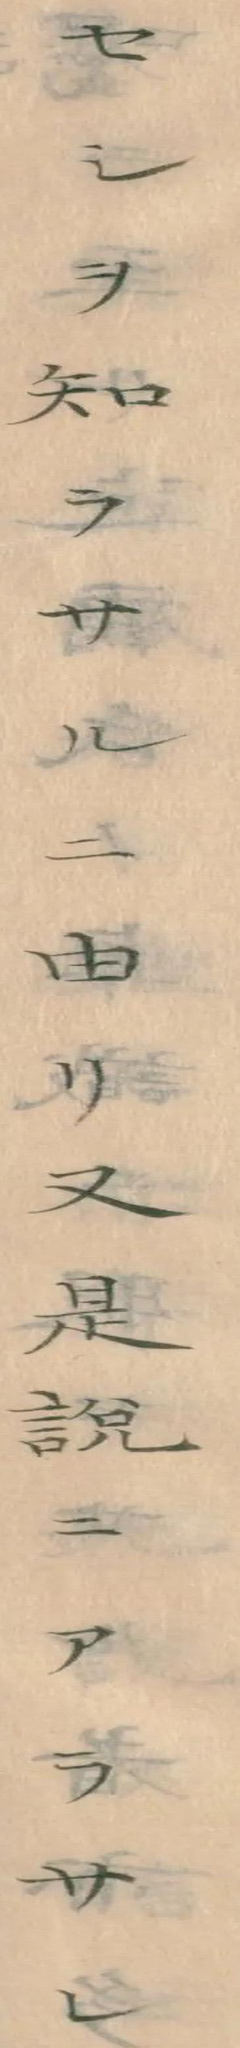セシヲ知ラサルニ由リ又是説ニアラサレ
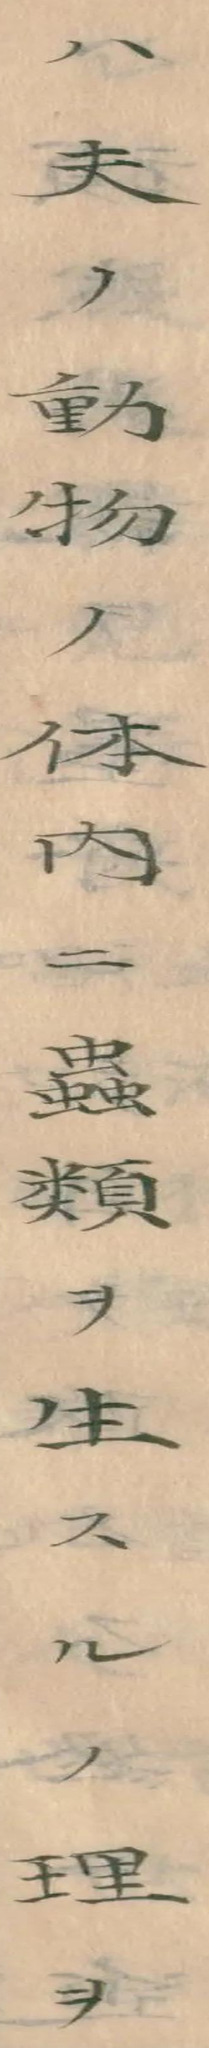ハ夫ノ動物ノ体内ニ虫類ヲ生スルノ理ヲ
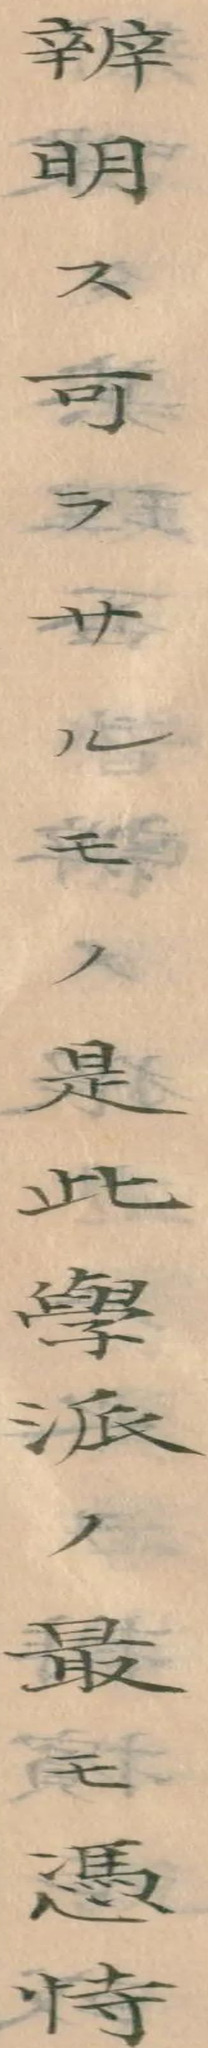弁明ス可ラサルモノ是此学派ノ最モ憑恃
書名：蚕桑集成
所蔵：国立国会図書館 National Diet Library, JAPAN
